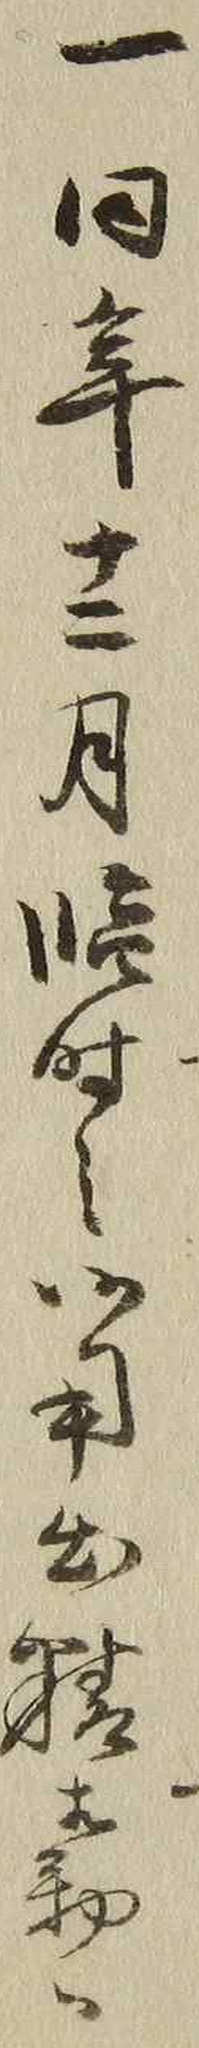一同年十二月臨時之御用出精相勤候
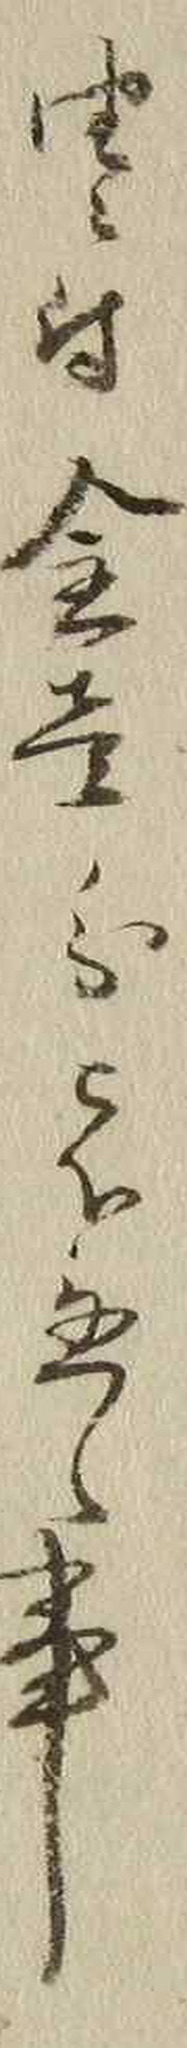由ニ付金壱分被下置候事
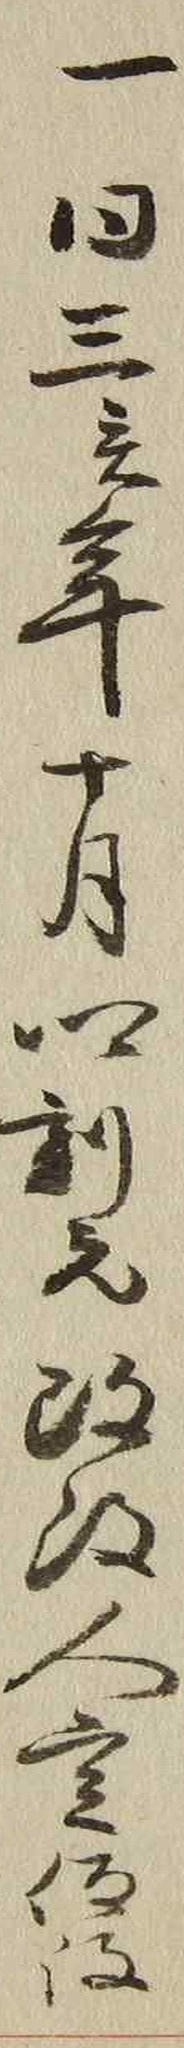一同三亥年十月郷割元改役人定仮役
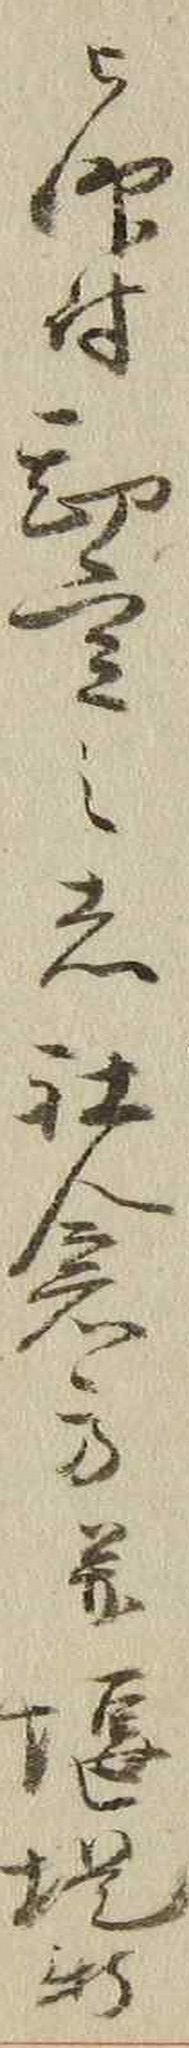被仰付勘定之者社倉方并堰堤新
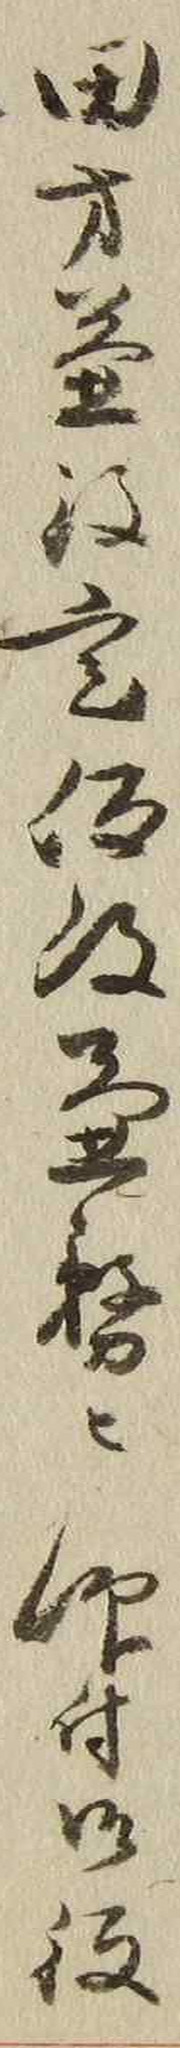田方兼役定仮役兼務被仰付御役
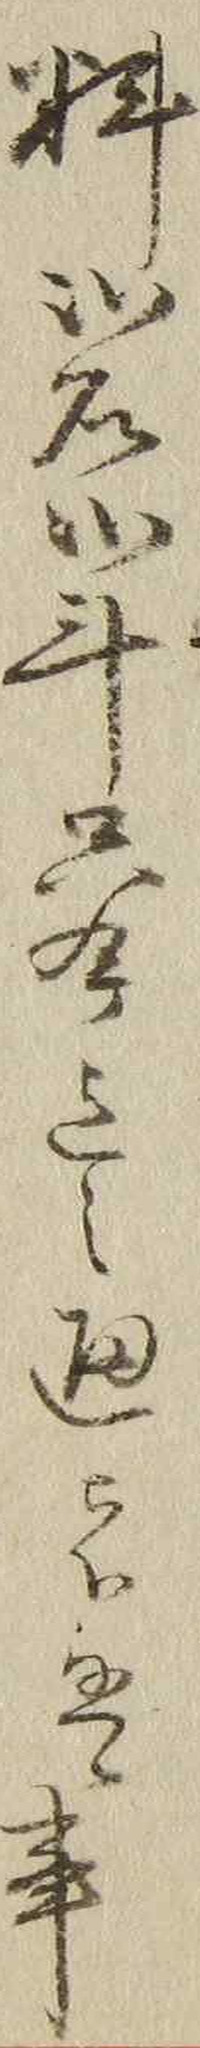料弐石弐斗只今迄之通被下置候事
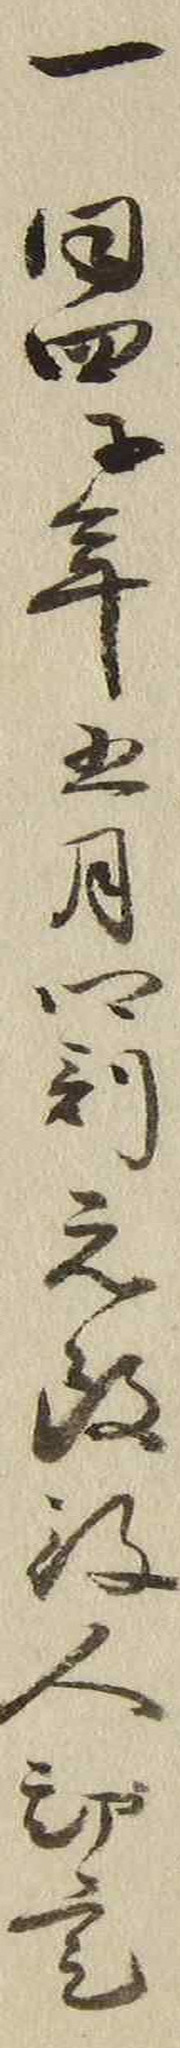一同四子年五月郷割元改役人勘定
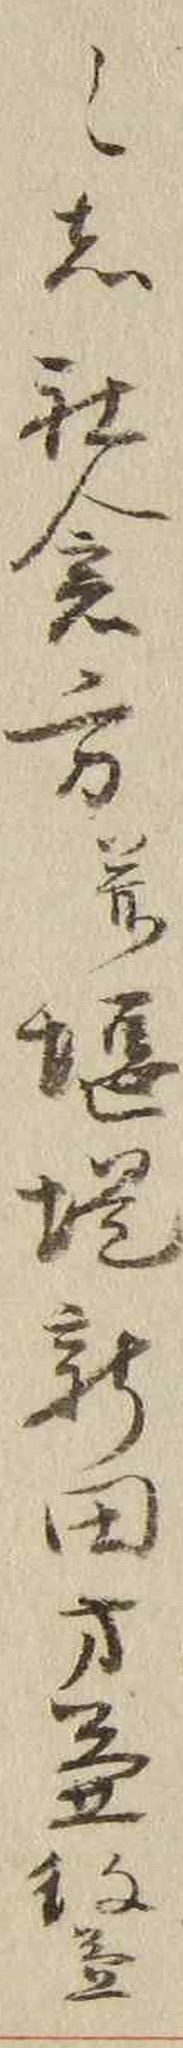之者社倉方并堰堤新田方兼役兼
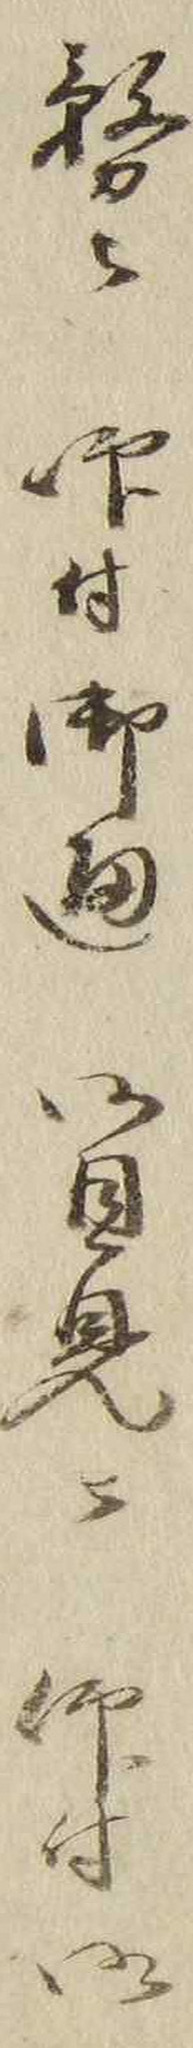務被仰付御通御目見被仰付御

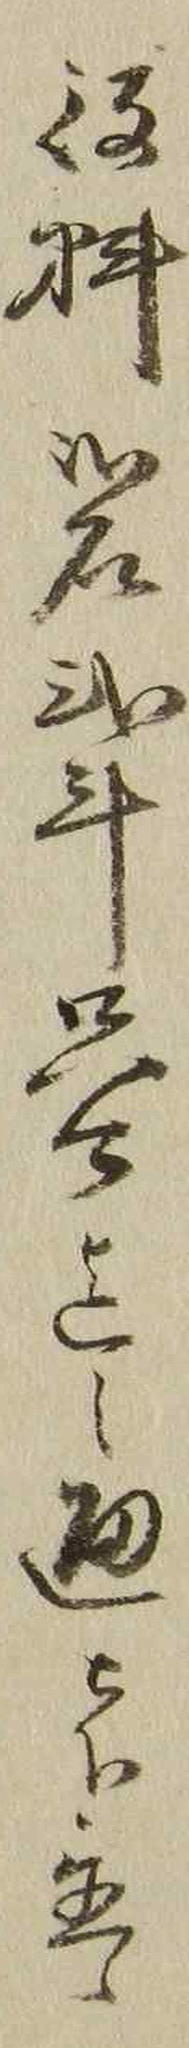役料弐石弐斗只今迄之通被下置候
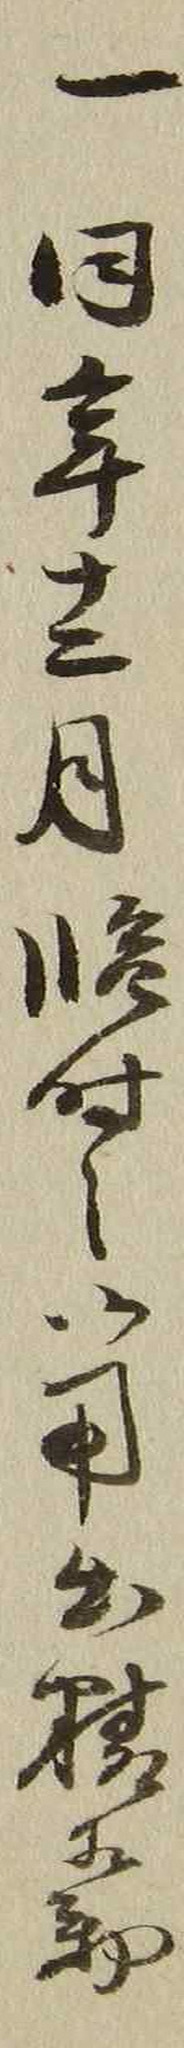一同年十二月臨時之御用出精相勤
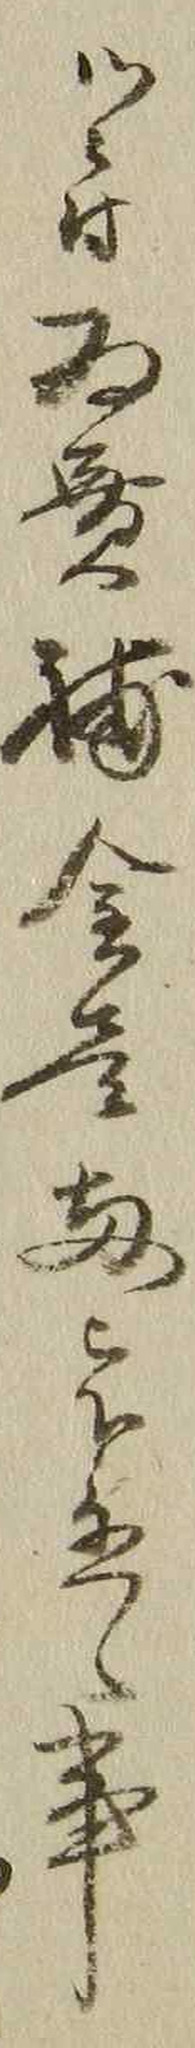候ニ付為費補金壱両被下置候事
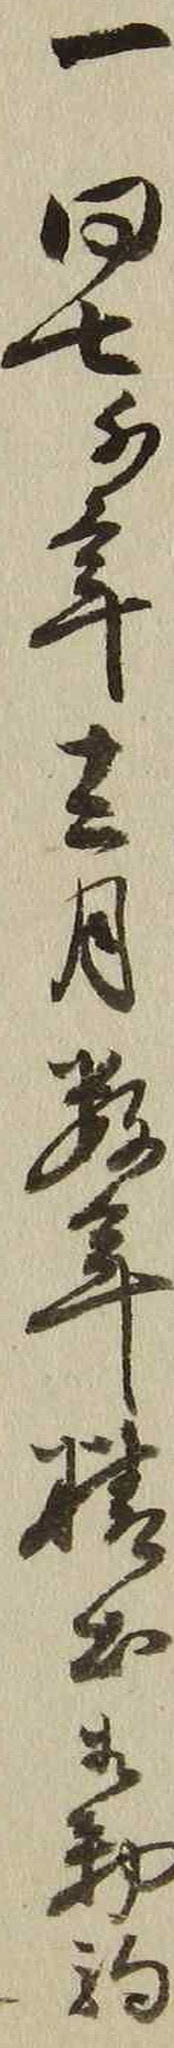一同七卯年十二月数年精出相勤駒
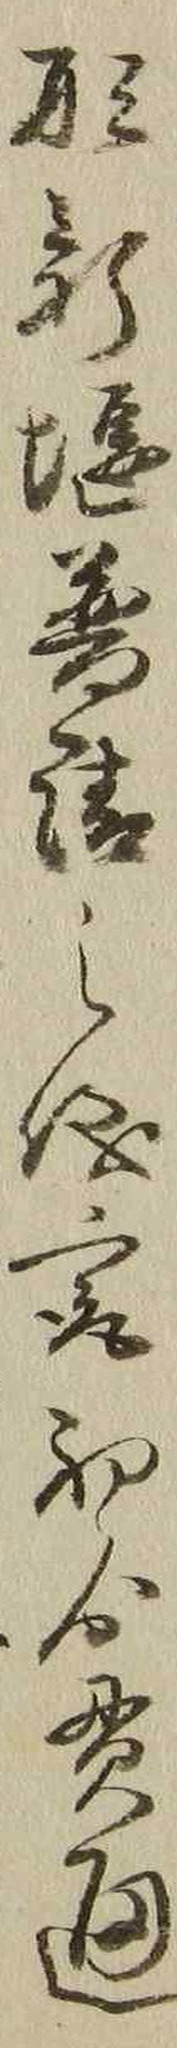形新堰普請之儀最初ゟ貫通
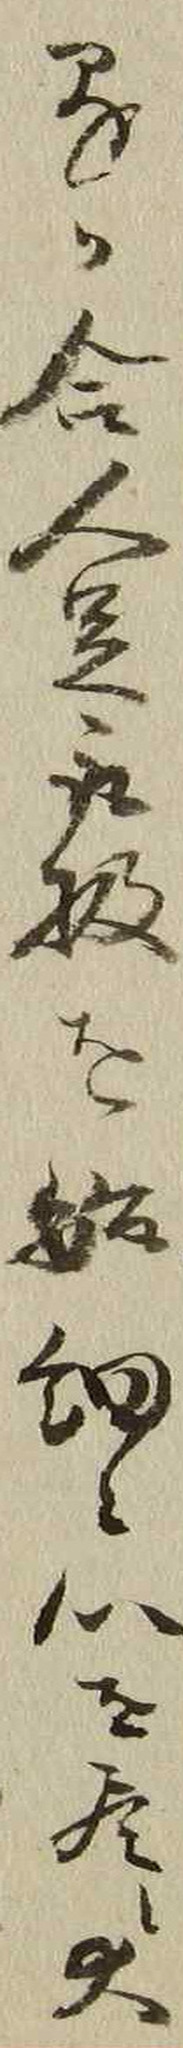懸り合人足取扱を始細々心を尽し大
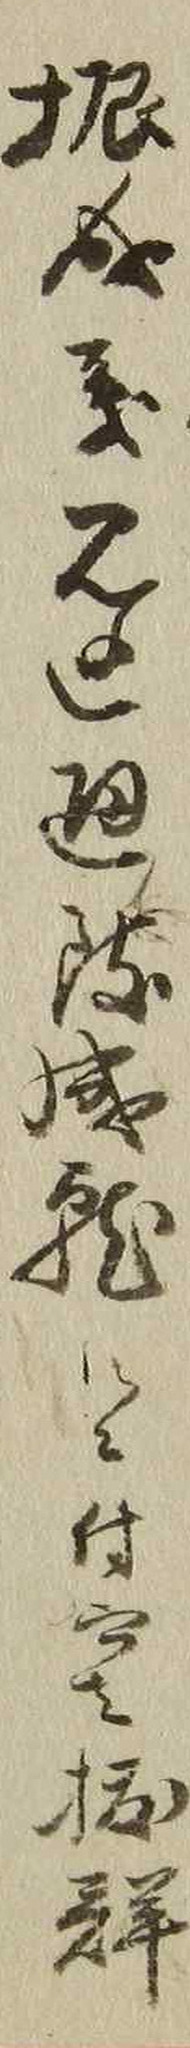振成義見込通致成就候ニ付而は抜群
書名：諸士系譜　巻之236　ふ之部4
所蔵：会津若松市立会津図書館
